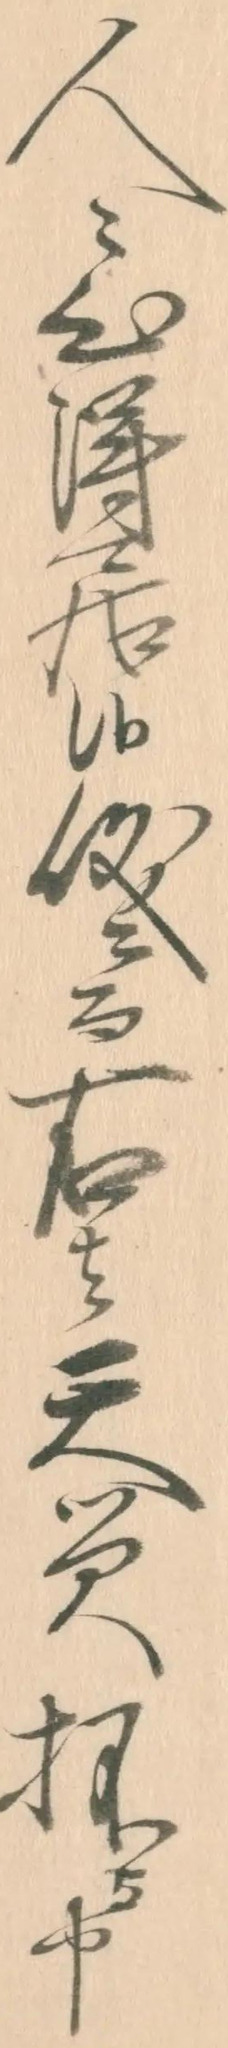人々心得居候儀ニ而右は天災抔と申
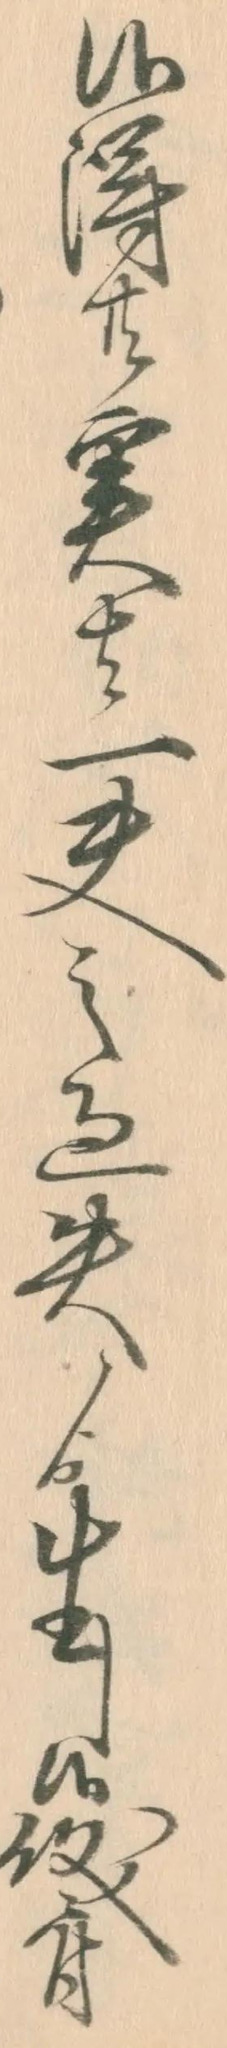候得共実は一夫之過失ゟ生し候儀ニ付
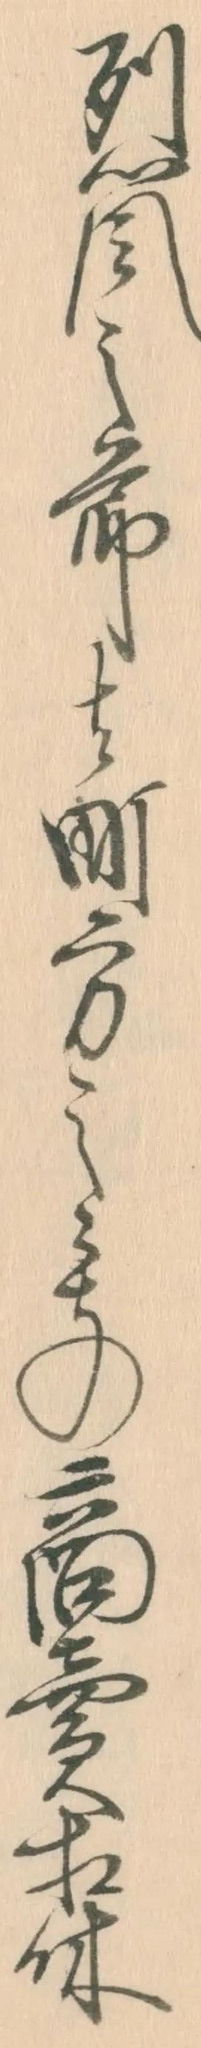烈風之節は町方之もの商売相休
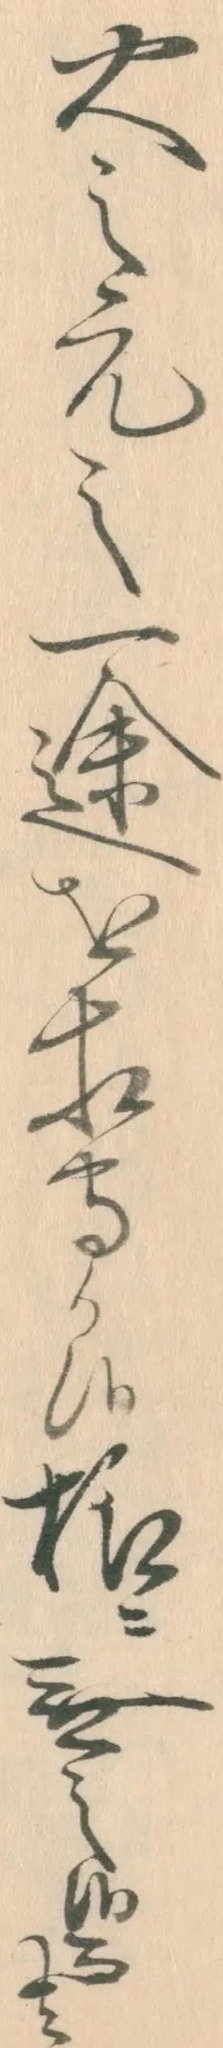火之元之一途を相守り候様ニ無之候而は
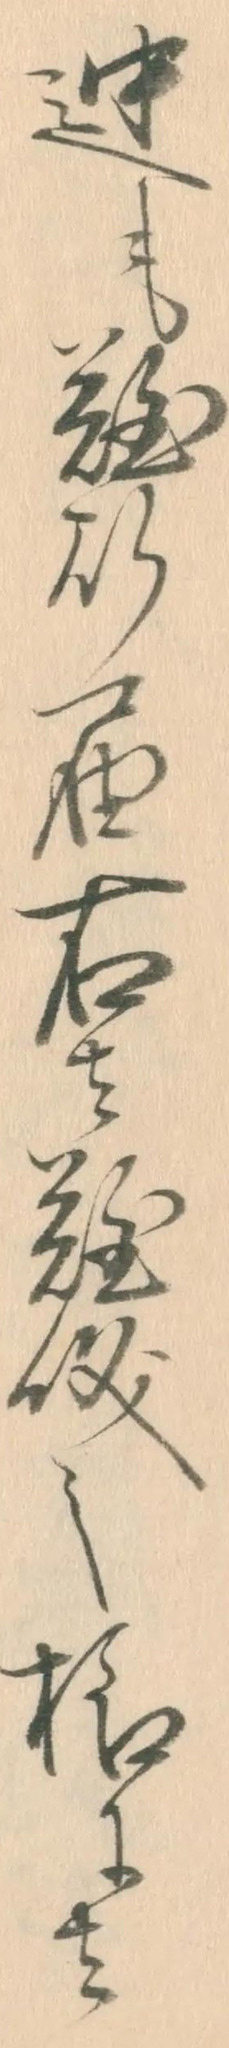迚も難行届右は難儀之様には
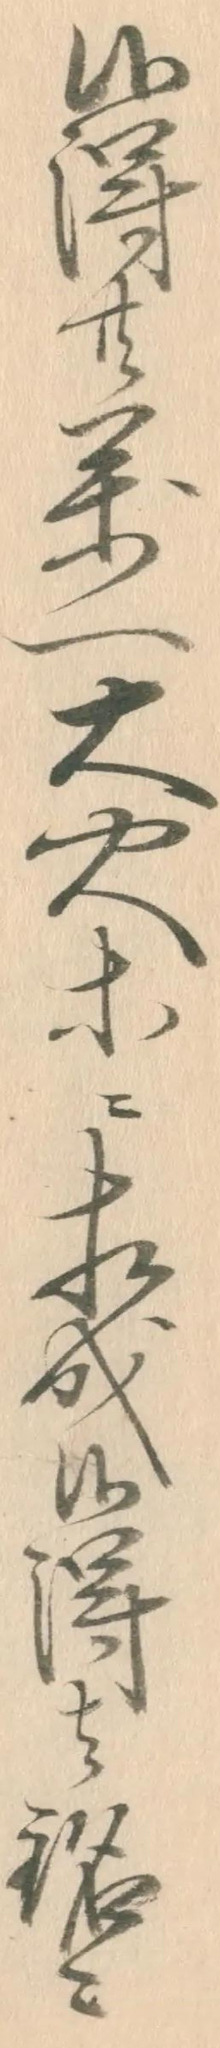候得共万一大火等ニ相成候得は銘々
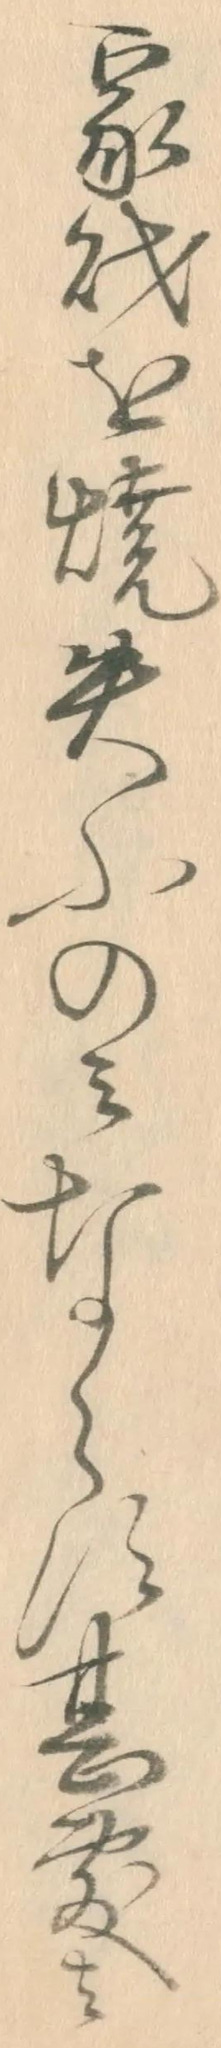家財を焼失ふのみならす甚敷は

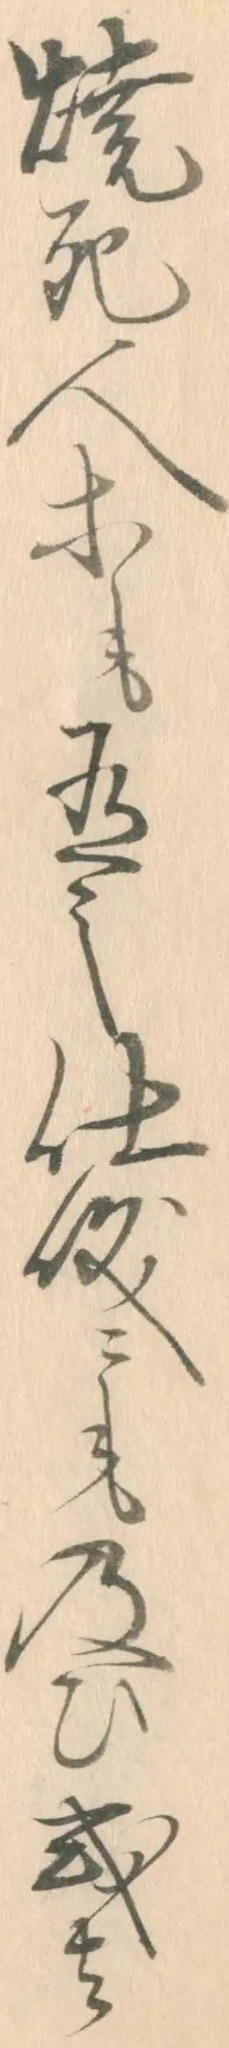焼死人等も有之仕儀ニも及ひ或は
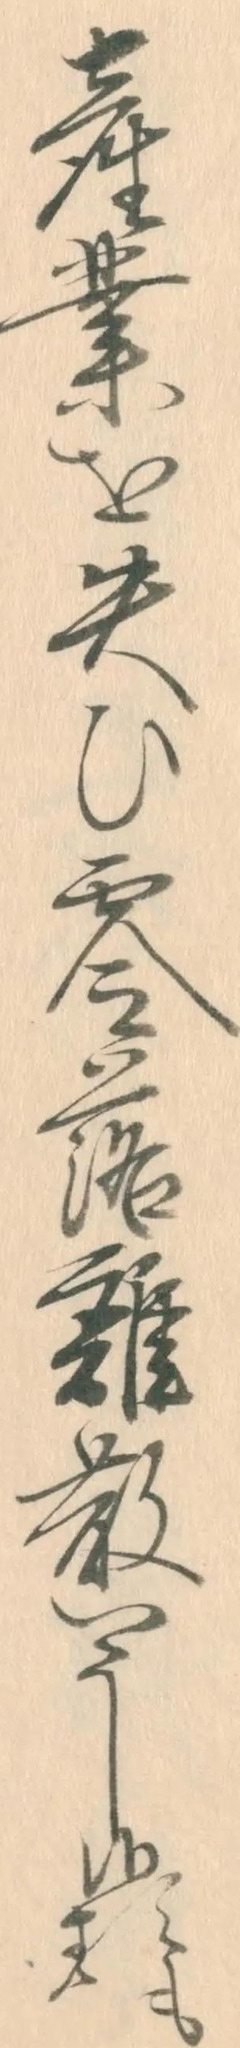産業を失ひ零落離散いたし候類も
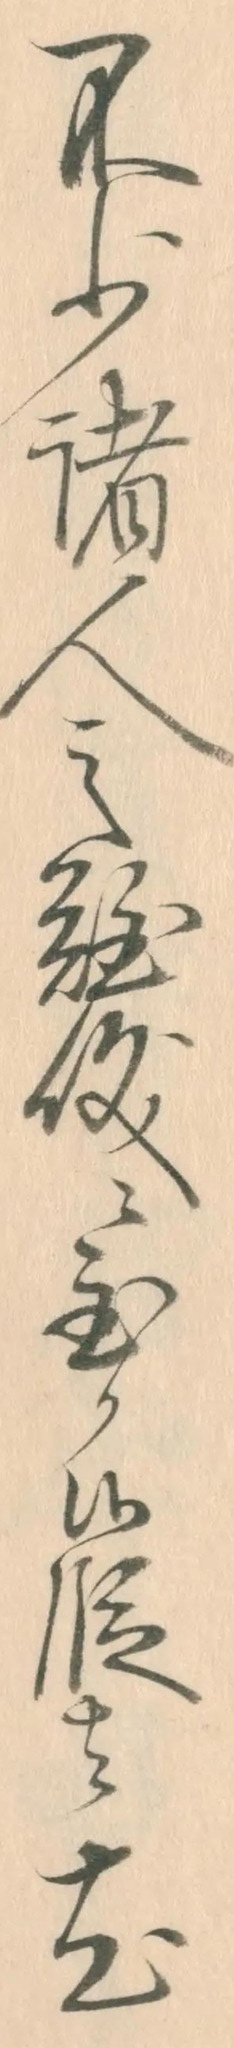不少諸人之難儀ニ至り候段は尤
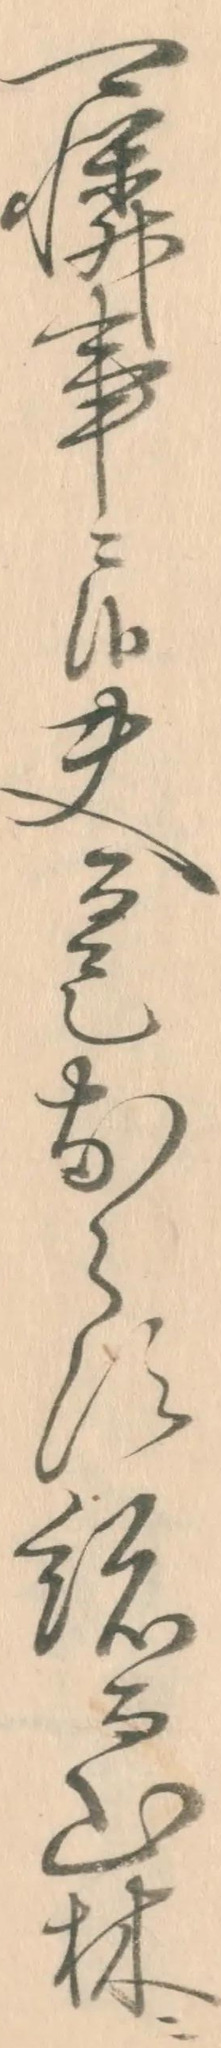可憐事ニ候夫而已ならす総而山林ニ
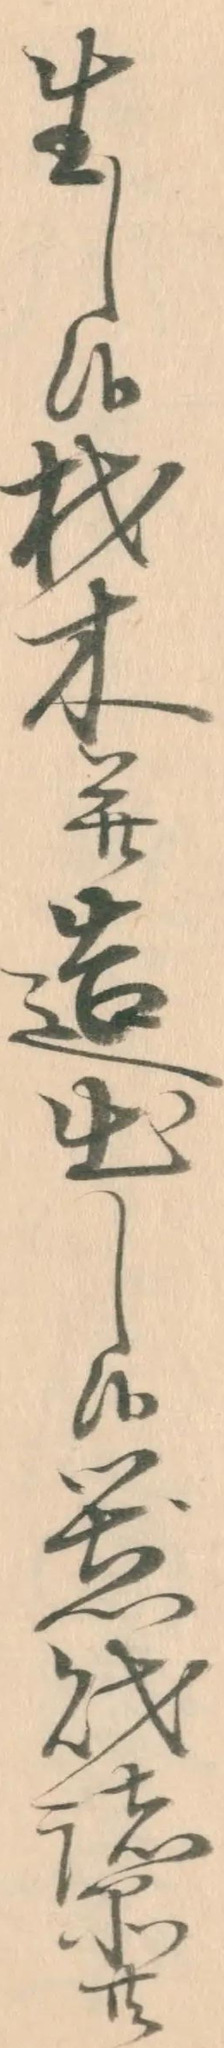生し候材木并造出し候器財諸品共
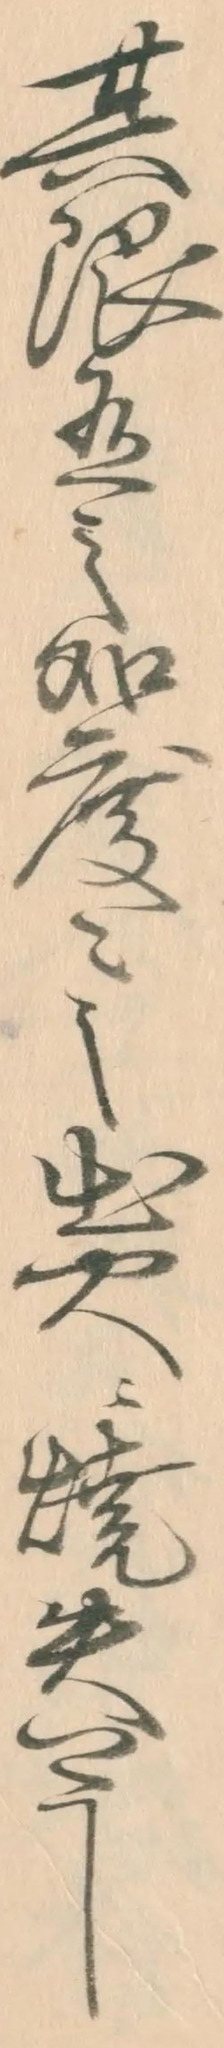其限有之処度々之出火ニ焼失いたし
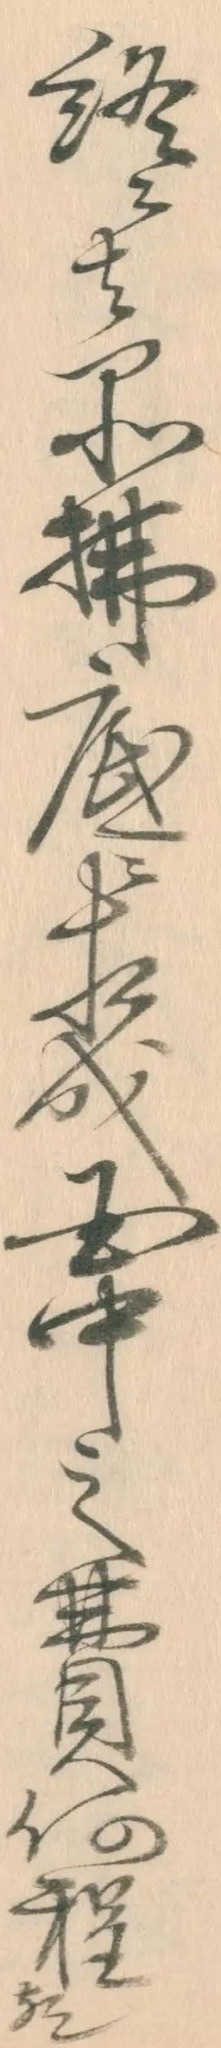終ニは品払底ニ相成国中之費何程歟
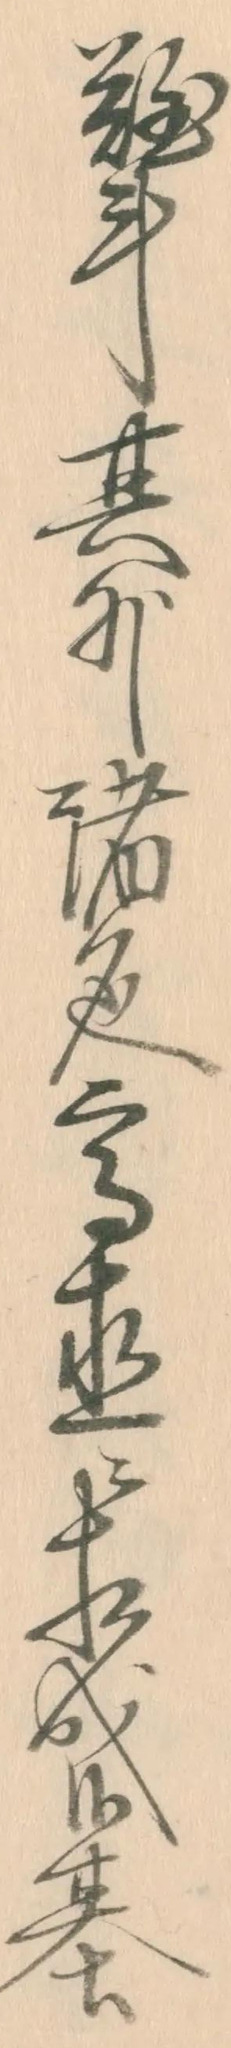難計其外諸色高直ニ相成候基
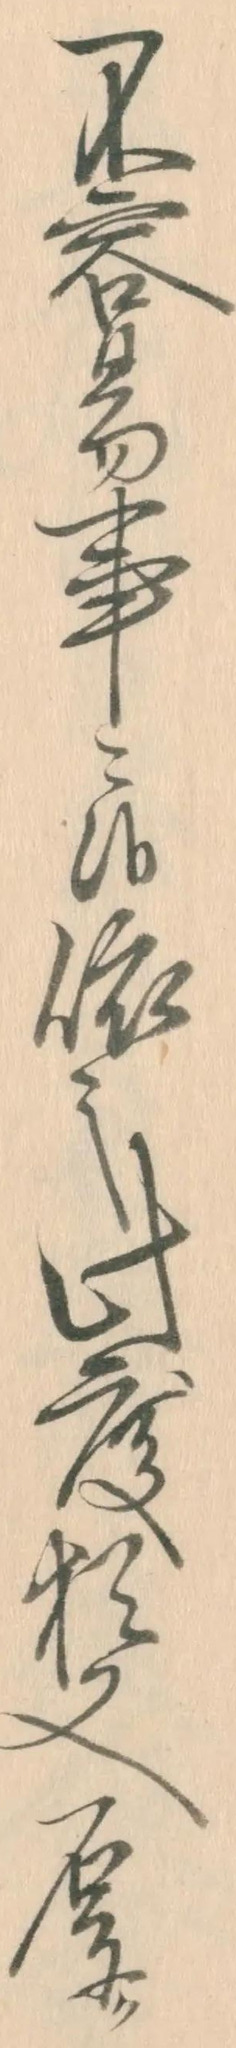不容易事ニ候依之此度猶又厚ク
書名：三橋 17巻. [7] 三橋小破御修復書留　但御奉行御掛リ替地震潰橋番屋　嘉永四亥年より安政二卯年迄　上
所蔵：国立国会図書館 National Diet Library, JAPAN
